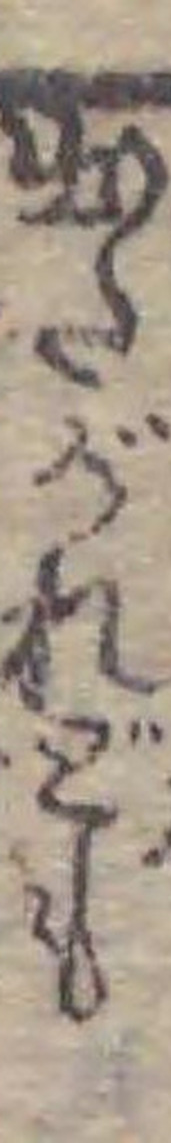出たがれども
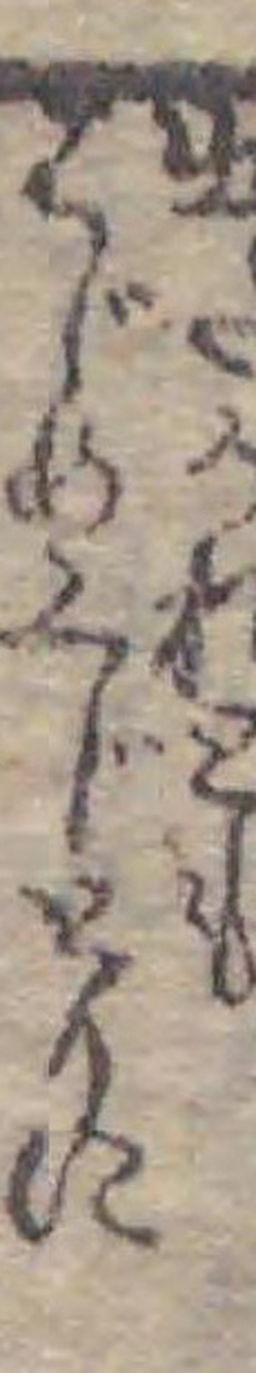はじめくじとりに
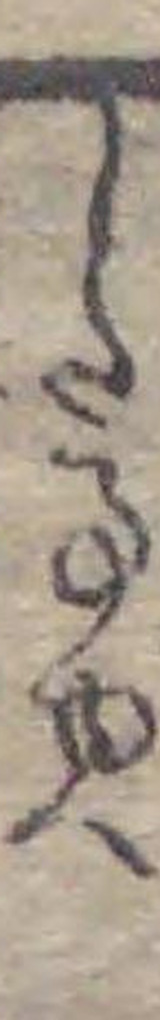した事ゆへ
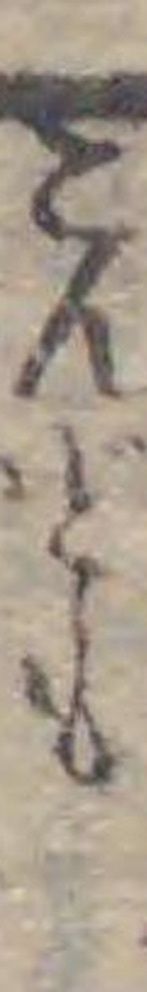こんども
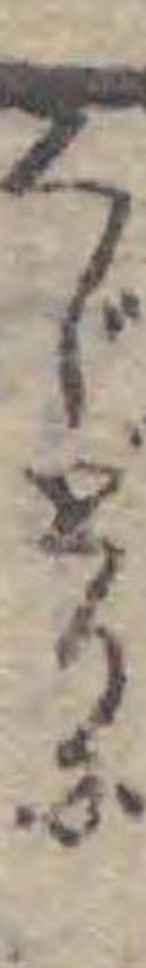くじとりに
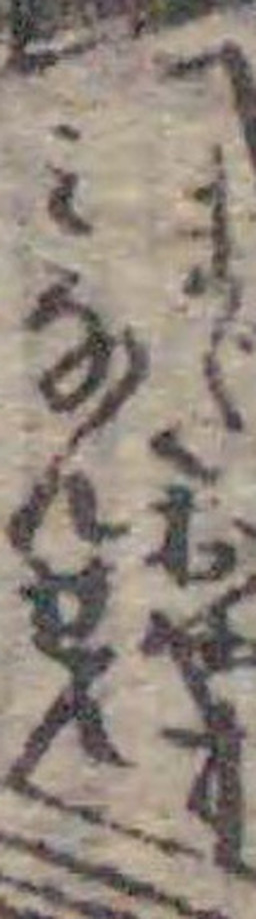みなんせん
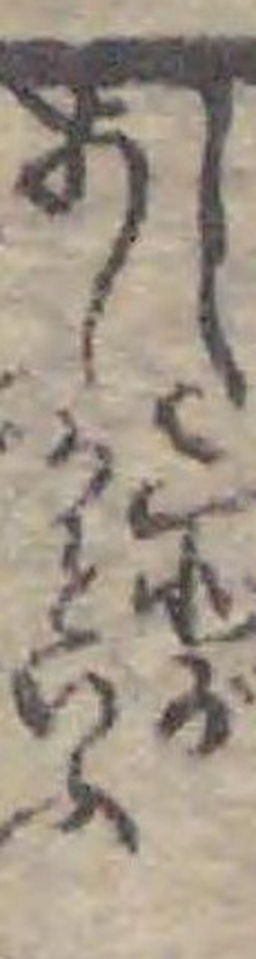あしかといふ
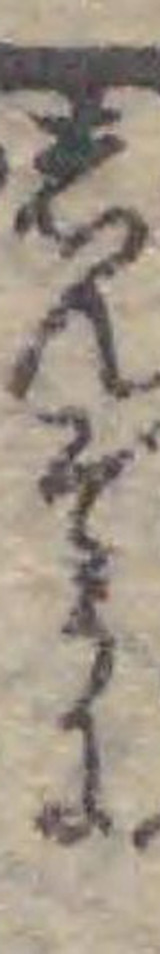しんぞうに
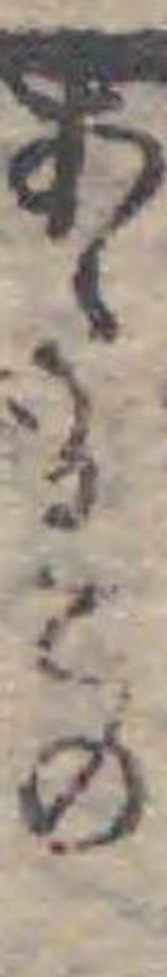あたるこの
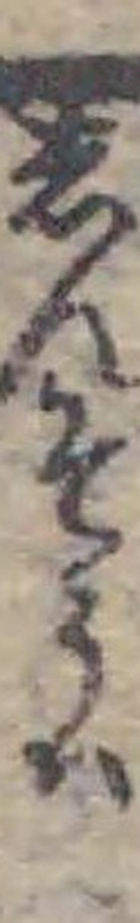しんぞうは
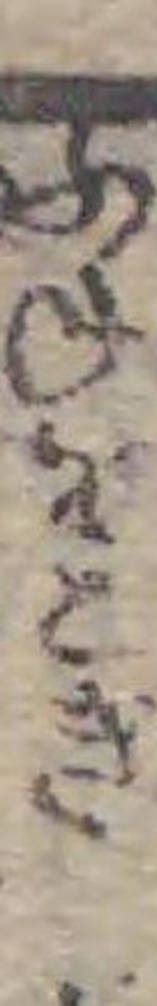ふねをこぎ
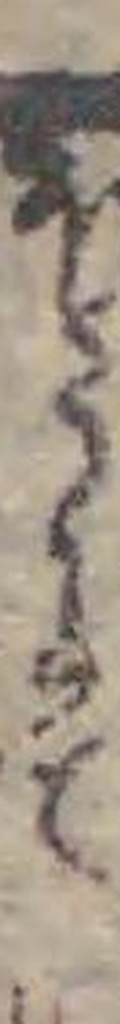ぼうにて
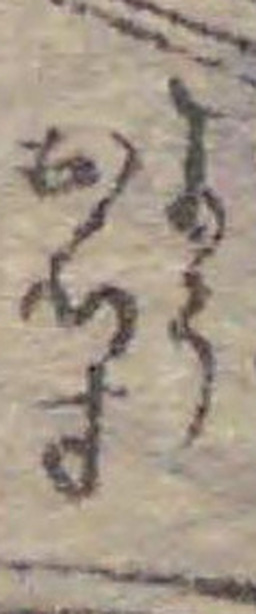おつす
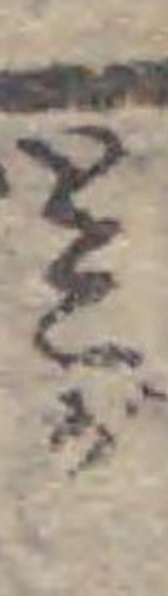とこが
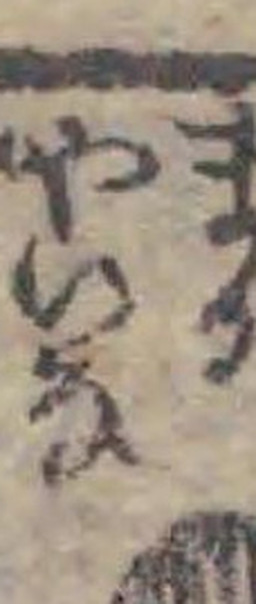やいな
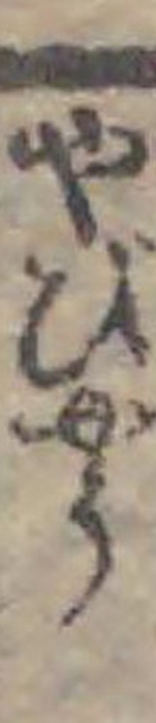やびやう
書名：竜宮苦界玉手箱 : 3巻
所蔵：国立国会図書館 National Diet Library, JAPAN
